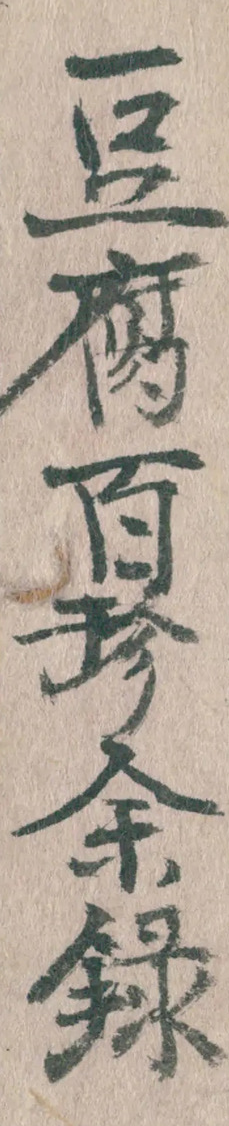豆腐百珍余録

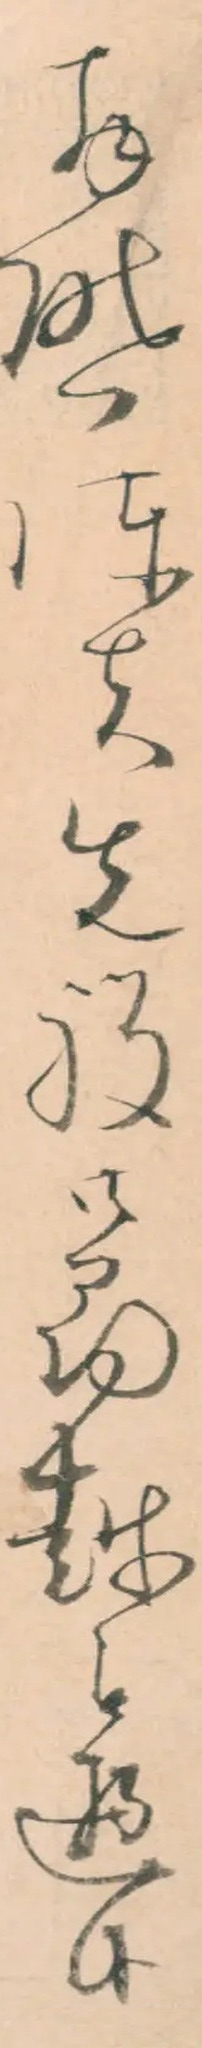拝啓陳は先般御尋越被遊候
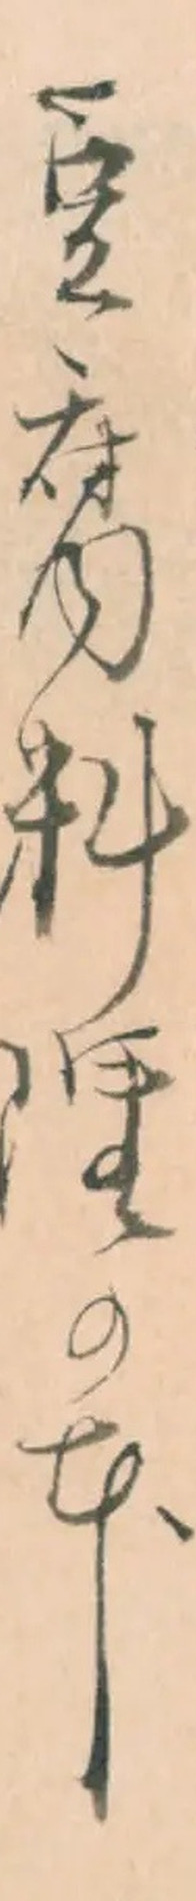豆腐料理の本
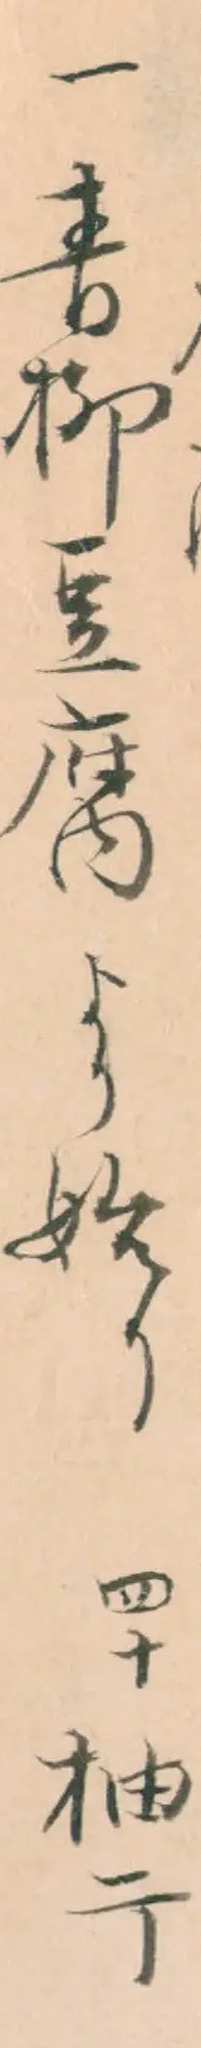一青柳豆腐より始り四十柚干
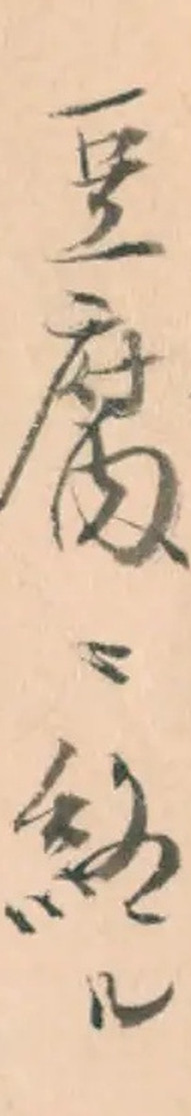豆腐に終る
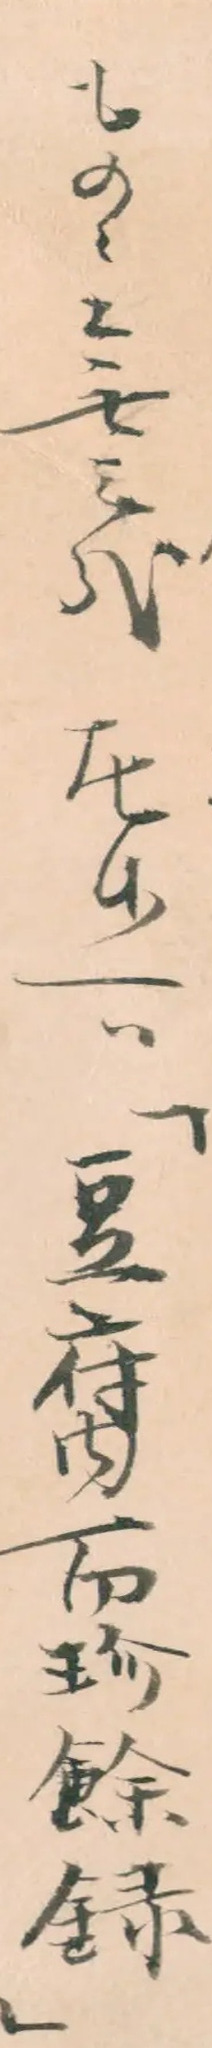ものに無之哉左候へは「豆腐百珍余録」
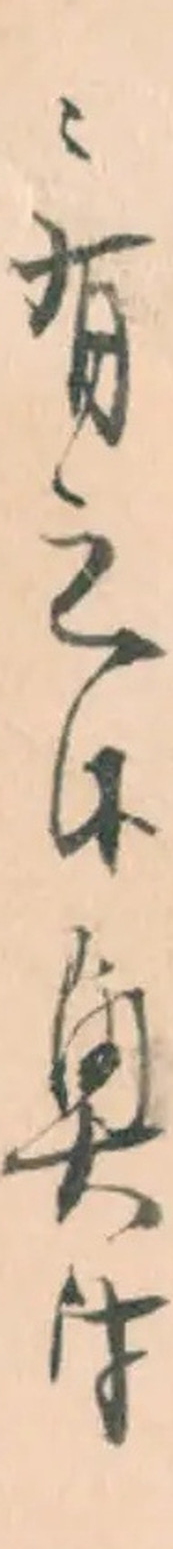に有之候奥付
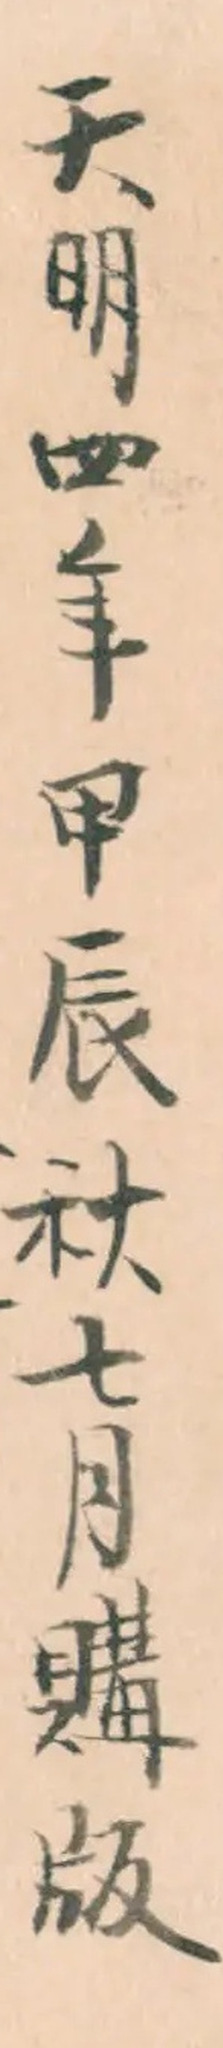天明四年甲辰秋七月購版
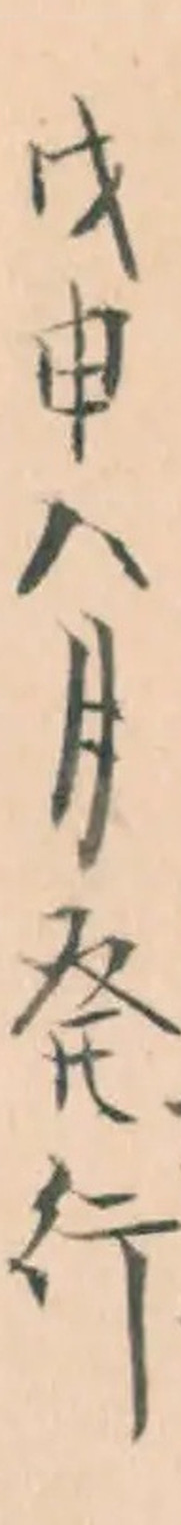戊申八月発行
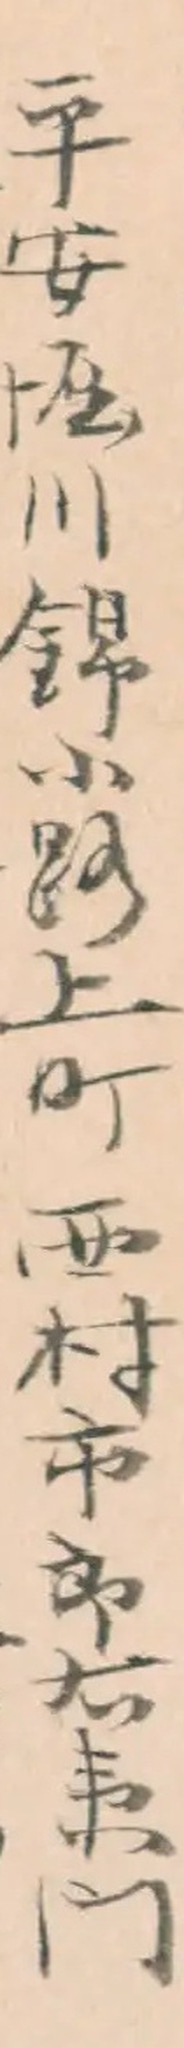平安堀川錦小路上町西村市郎右衛門
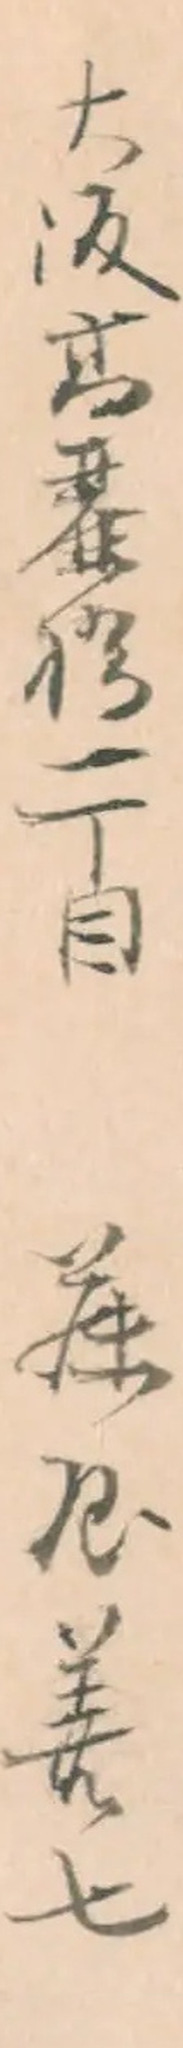大阪高麗橋一丁目藤屋善七

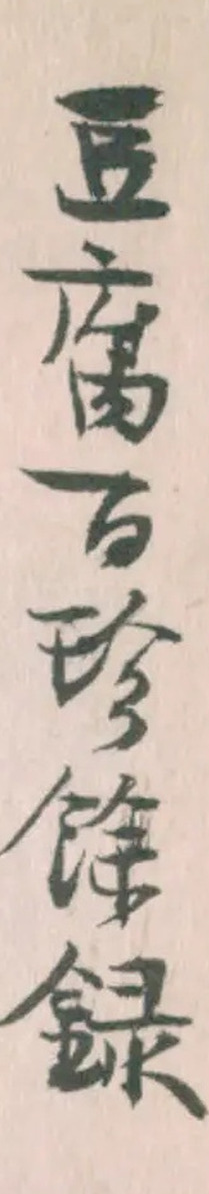豆腐百珍余録
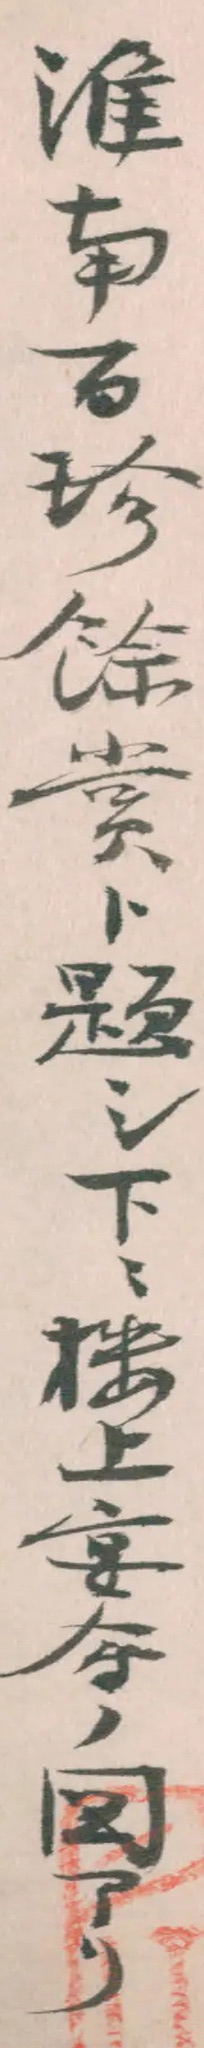淮南百珍余賞と題し下に楼上宴会の図あり
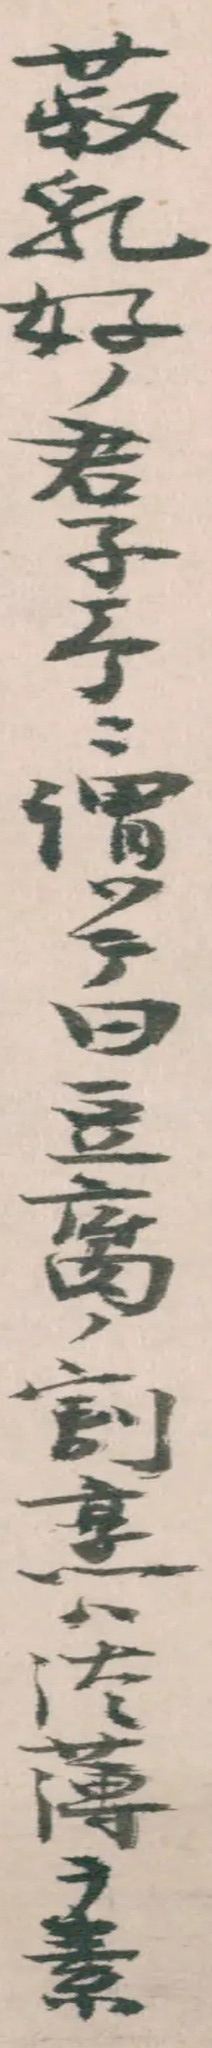菽乳好の君子予に謂つて曰豆腐の割烹は淡薄を素
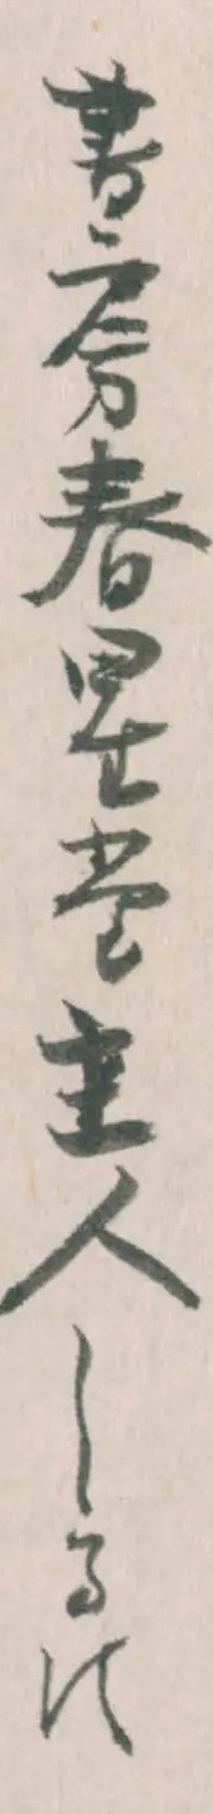書房春星堂主人しるす

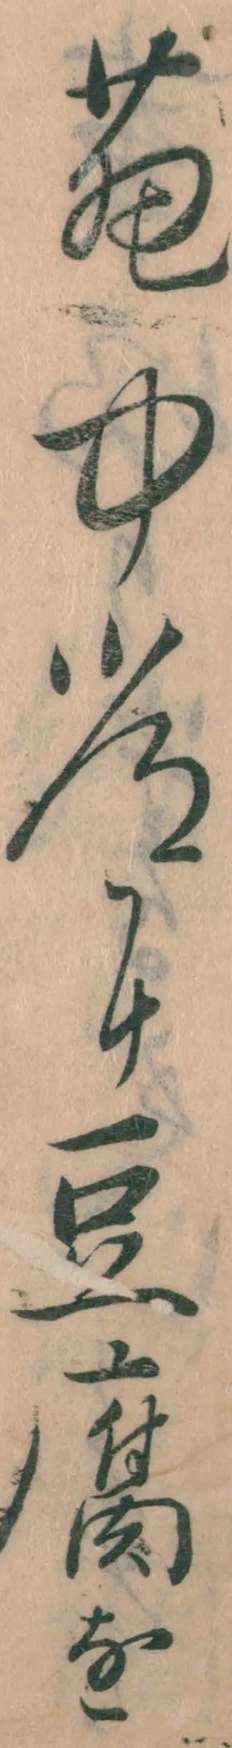庵中常に豆腐を
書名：豆腐百珍余録
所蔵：国立国会図書館 National Diet Library, JAPAN
